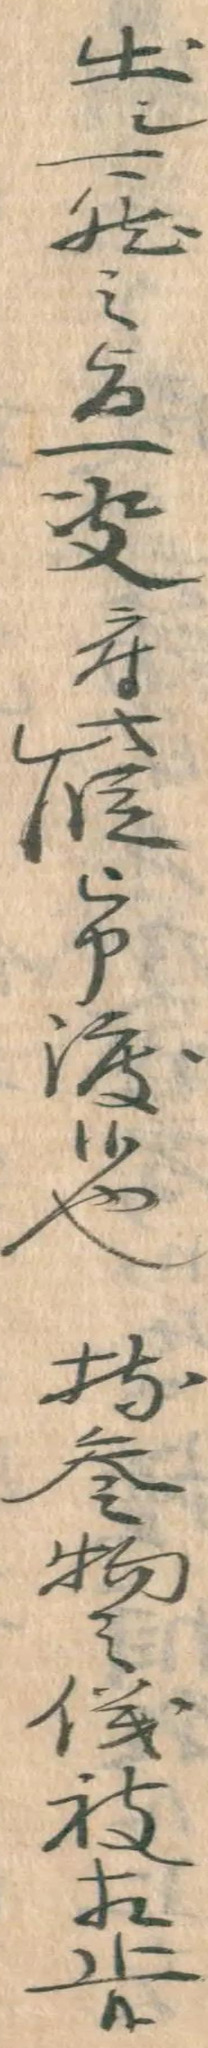出シ可然之旨一決ニ付此段被申渡候也持参物之儀被相止候
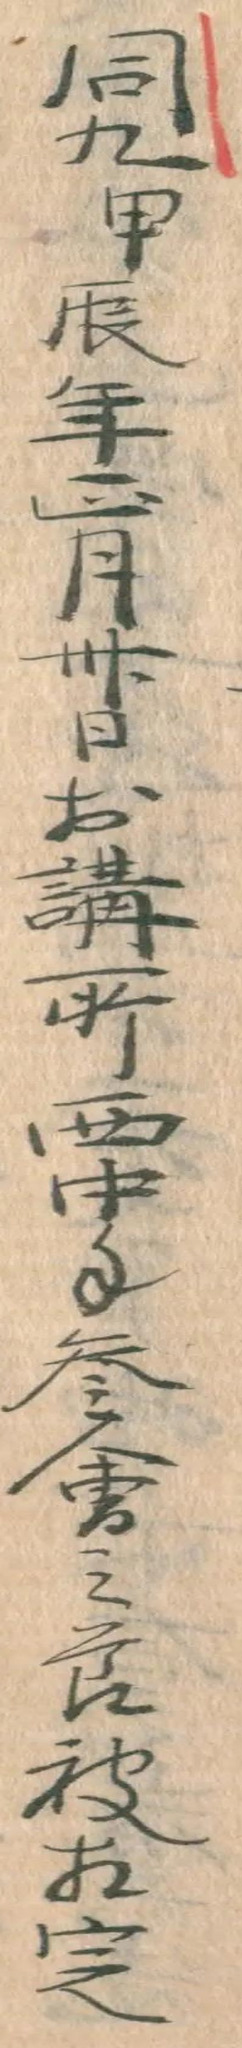同九甲辰年正月卅日於講所西中手参會之節被相定
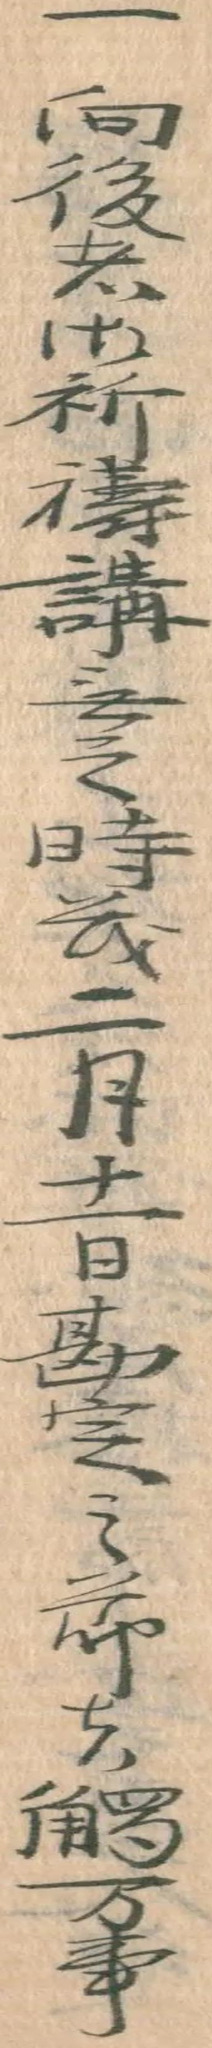一向後者御祈祷講無之時も二月十一日勘定之節は觸万事
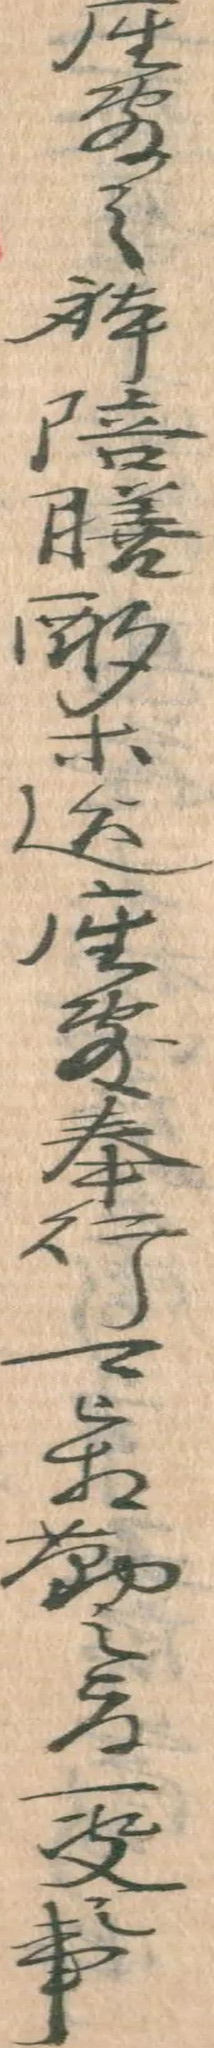座敷之躰陪膳酌等迄座敷奉行可被相勤之旨一決之事
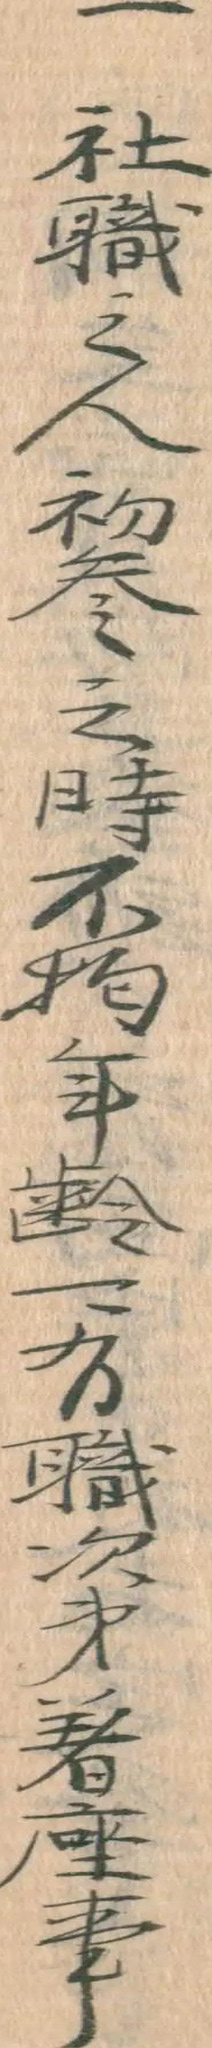一社職之人初参之時不拘年齢可有職次第着座事
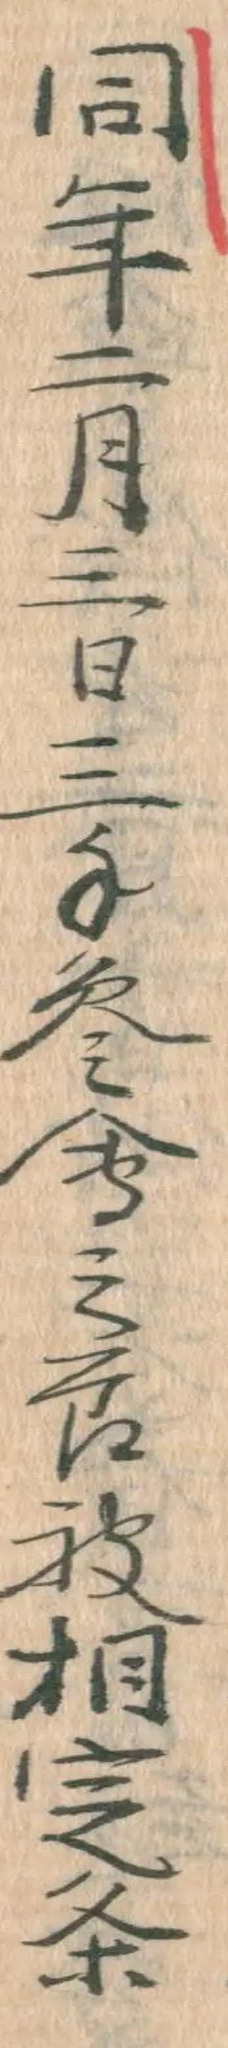同年二月三日三手参會之節被相定条
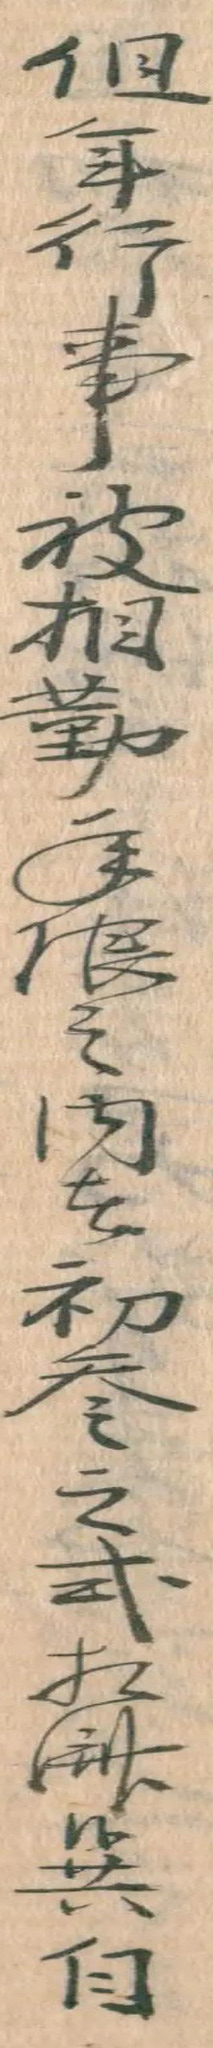但年行事被相勤年限之内は初参之式相済候共自
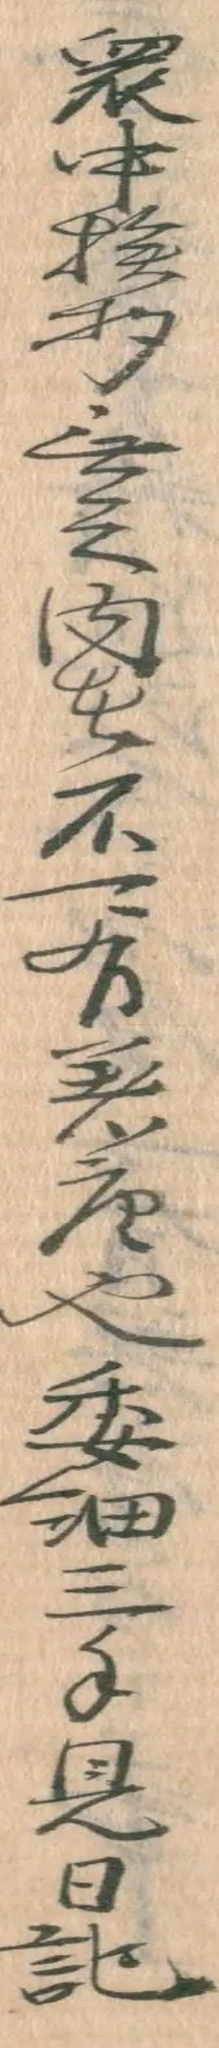衆中挨拶無之内者不可有着座也委細三手見日記
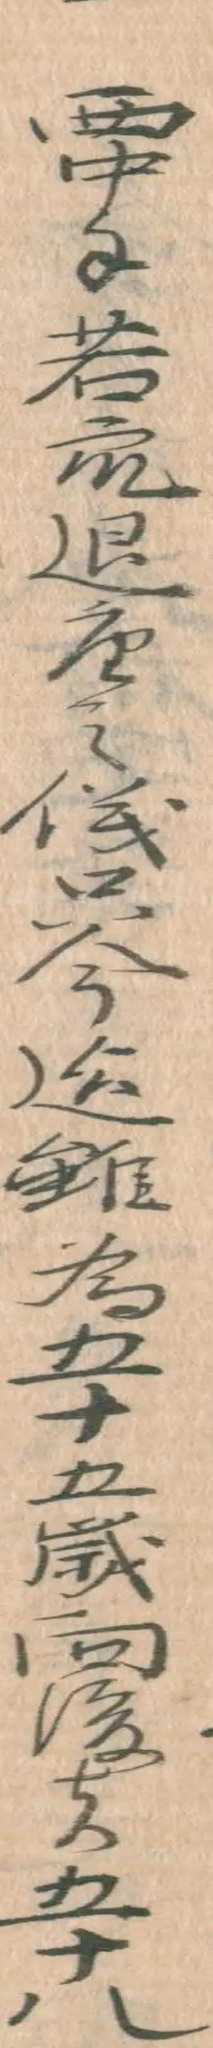一西中手若衆退座之儀只今迄雖為五十五歳向後は五十八
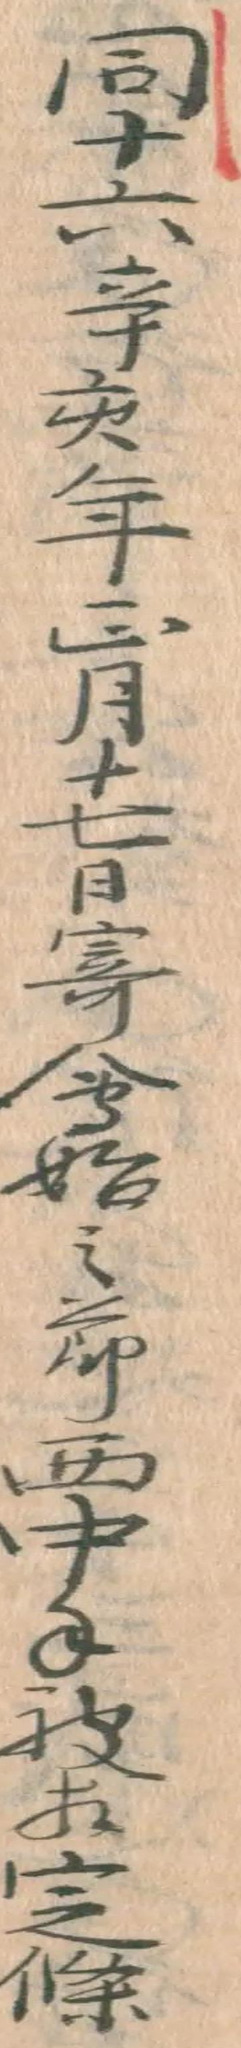同十六辛亥年正月十七日寄會始之節西中手被相定條
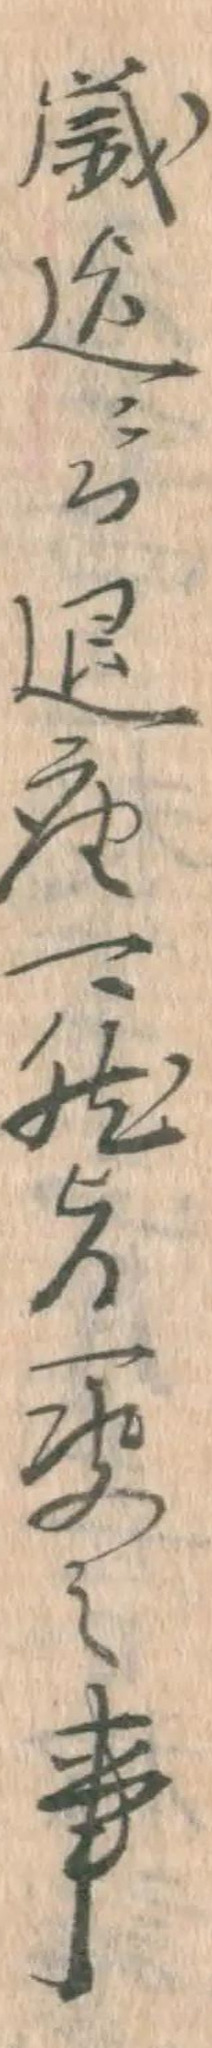歳迄ニ而退座可然旨一決之事
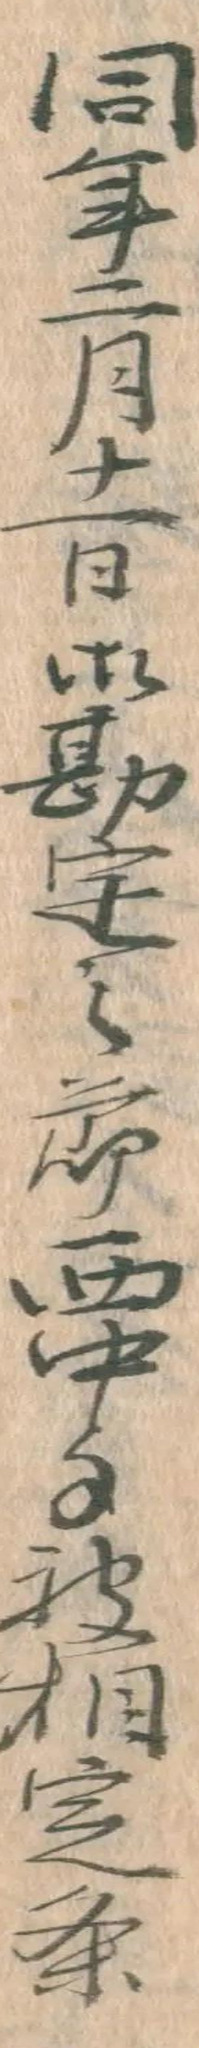同年二月十一日御勘定之節西中手被相定条
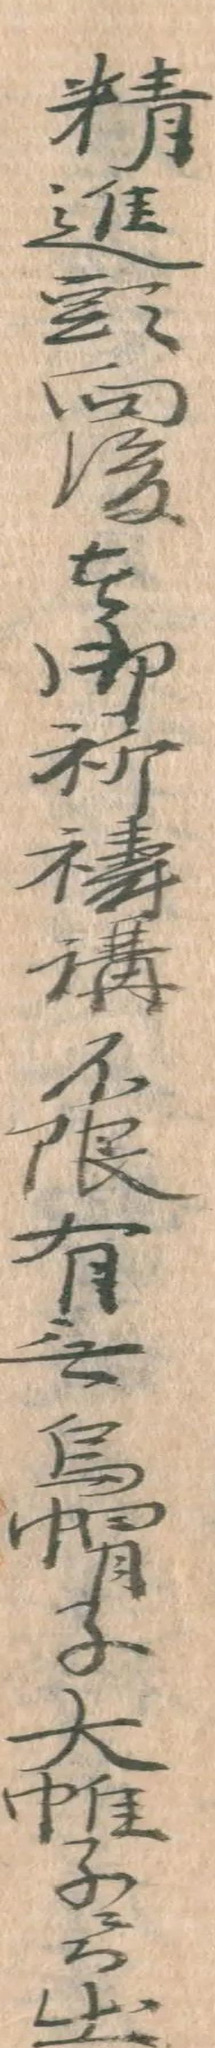一精進頭向後は御祈祷講不限有無烏帽子大帷子ニ而出
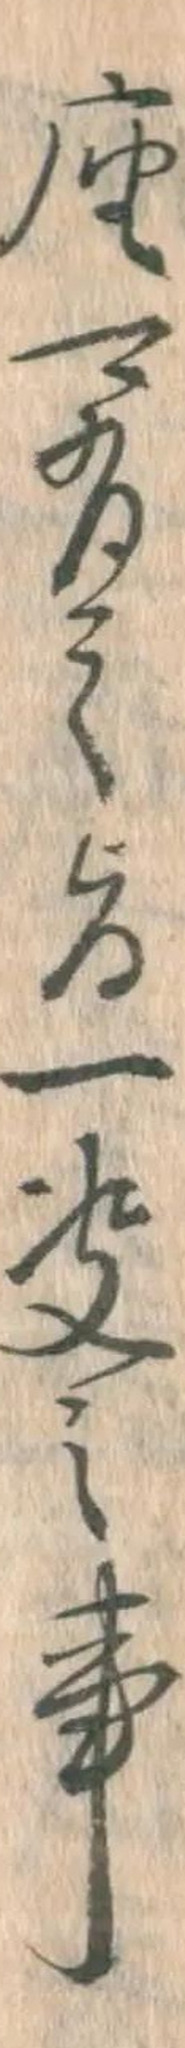座可有之旨一決之事
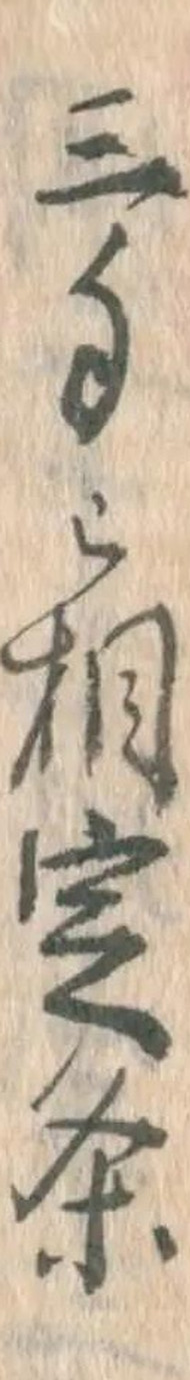三手被相定条
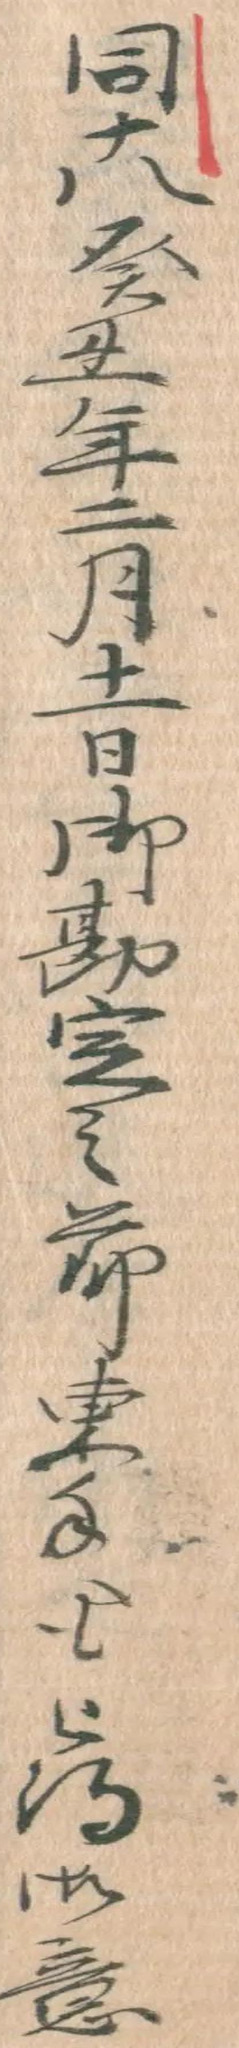同十八癸丑年二月十一日御勘定之節東手へも被得御意
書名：賀茂社記録. 第29冊
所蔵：国立国会図書館 National Diet Library, JAPAN
